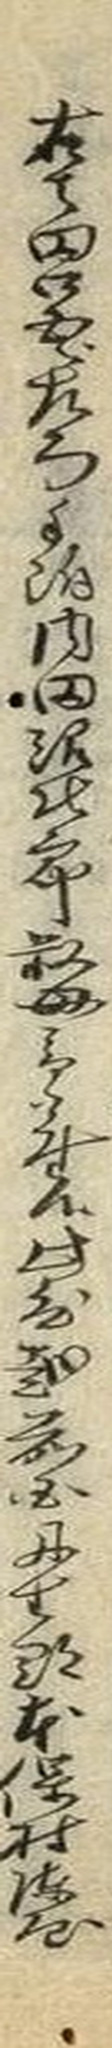右者田口五郎左衛門手附内田銀次郎叔母ニ而御座候此度越前国丹生郡本保村陣屋
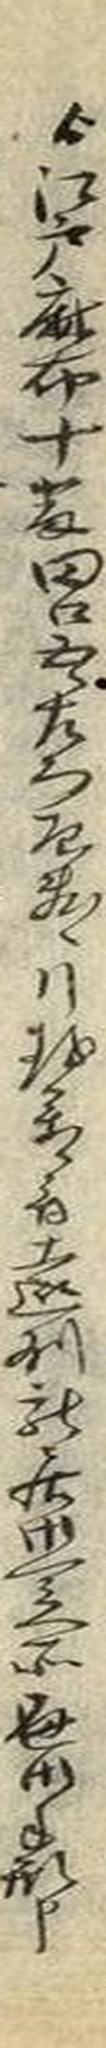ゟ江戸麻布十番田口五郎左衛門屋敷へ引越参候ニ付遠州新居御関所通御手形申
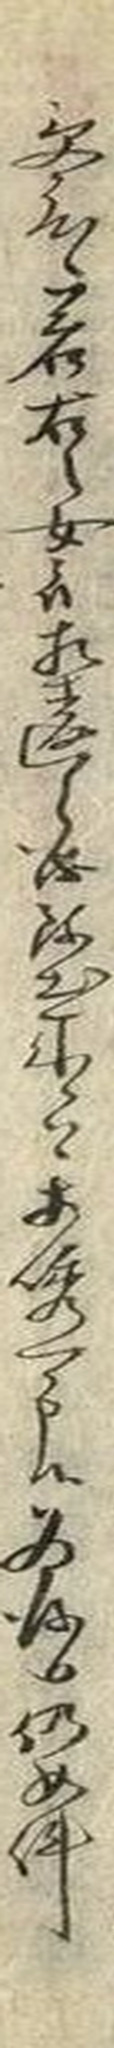受度候若右之女ニ付相違之儀致出来候ハヽ相唀可申候為後日仍如件
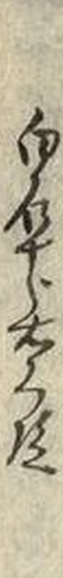白石十郎右衛門殿
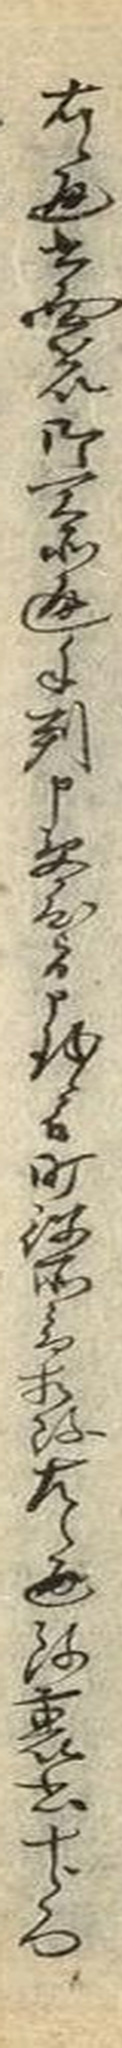右之通書面を以御関所通手判申受度旨申越候ニ付町役所ニ而相改左之通致裏書十郎右衛門
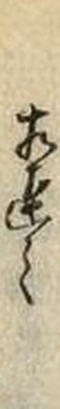相達之
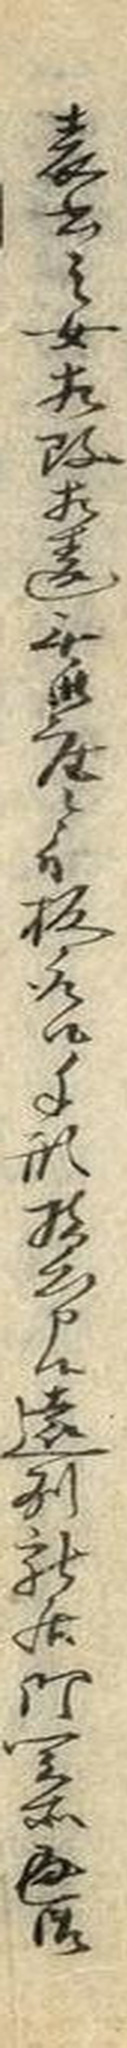表書之女相改相違無御座候ニ付板取口手形指出申候遠州新居御関所通御
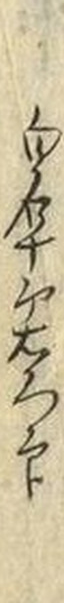白石十郎右衛門殿
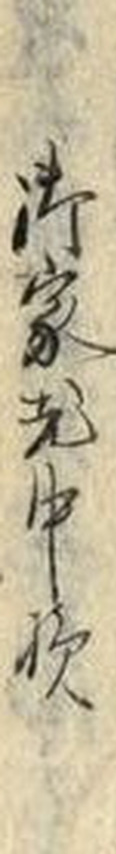御家老中様

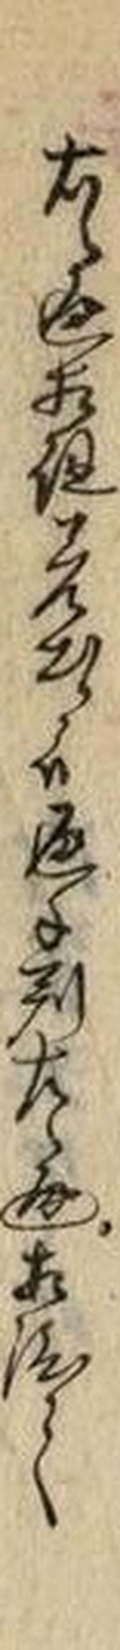右之通相認差出候ニ付通手判左之通相渡之候
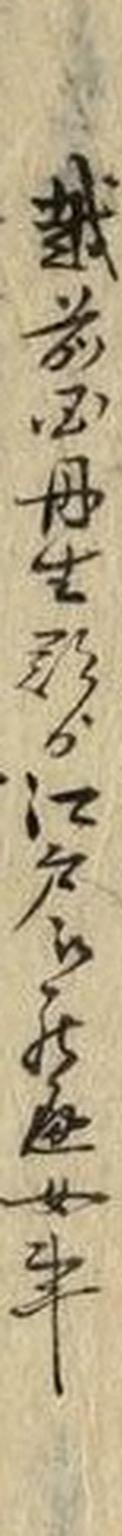越前国丹生郡ゟ江戸江罷通女事
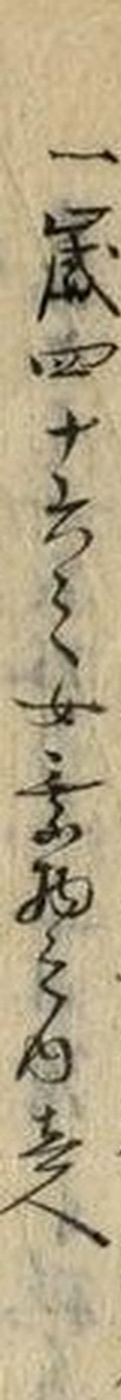一歳四十六之女乗物之内壱人
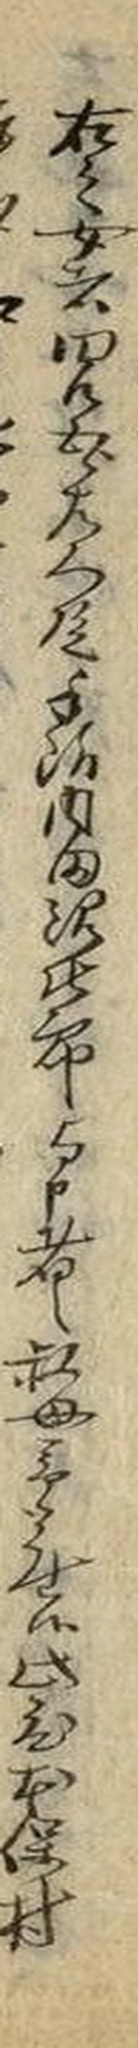右之女者田口五郎左衛門殿手附内田銀次郎与申者之叔母ニ而御座候此度本保村
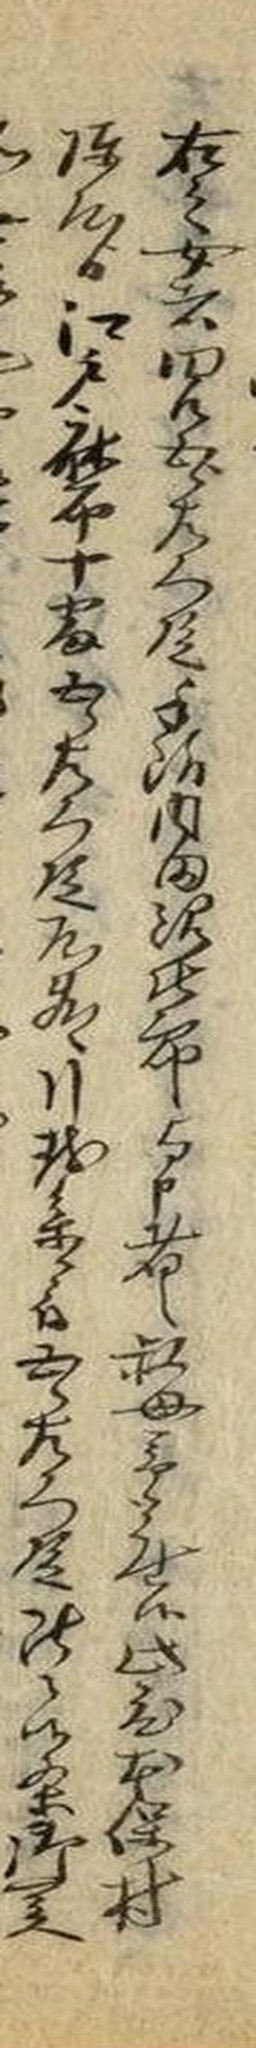陣屋ゟ江戸麻布十番五郎左衛門殿屋敷へ引越参候ニ付五郎左衛門殿断ニ候条御関
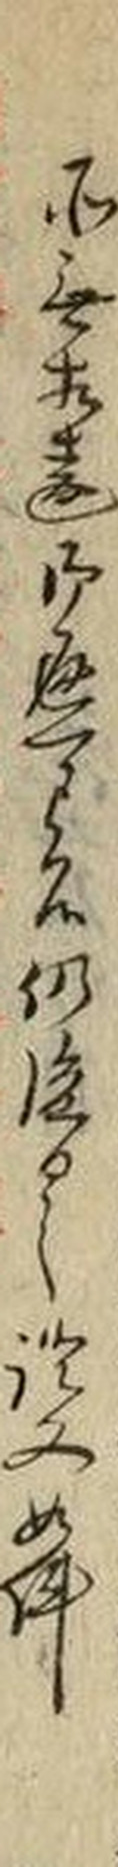所無相違御通可被下候仍後日之証文如件
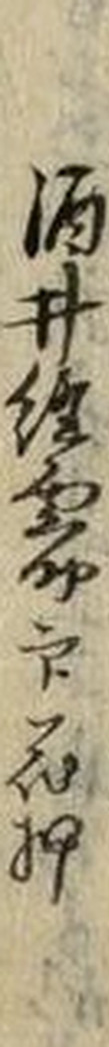酒井縫殿助印花押
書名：御国他国諸事之部
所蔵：福井県文書館 Fukui Prefectural Archives
